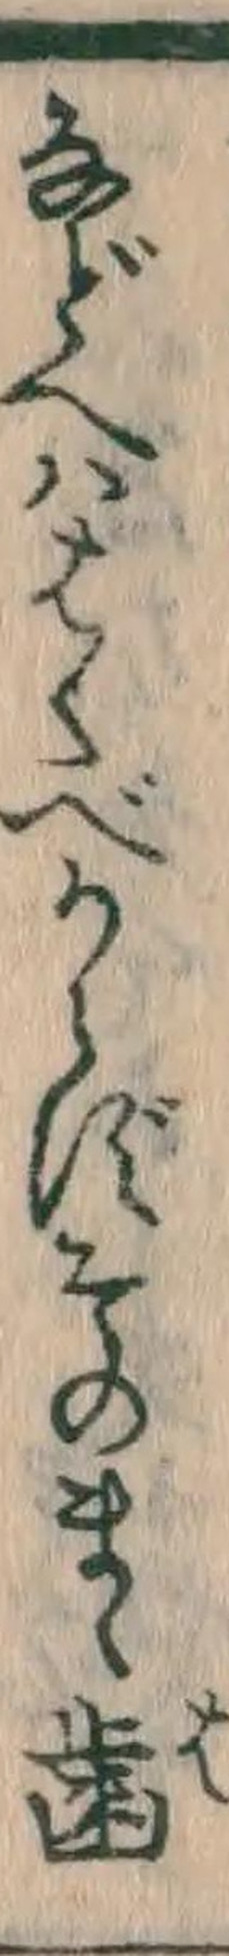などへははくべからずそのまゝ歯
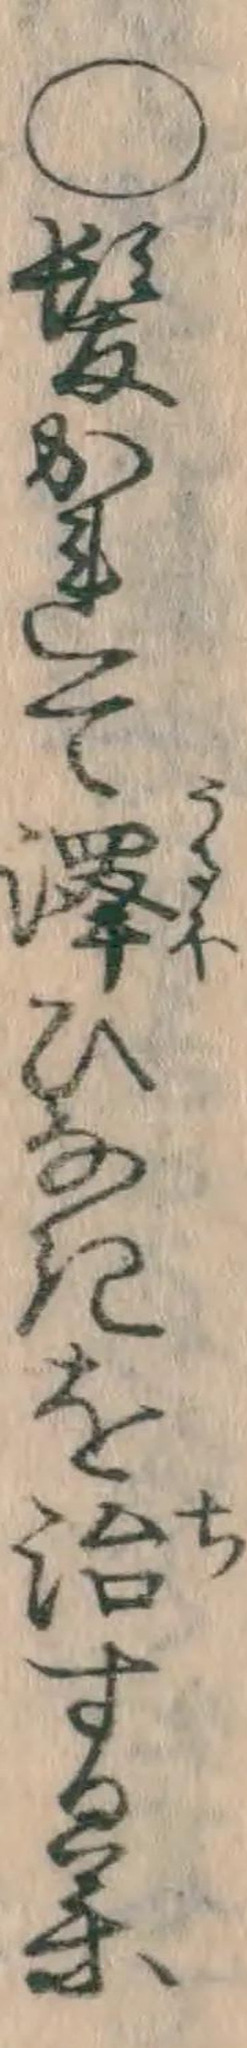○髪かれて沢ひなきを治する薬
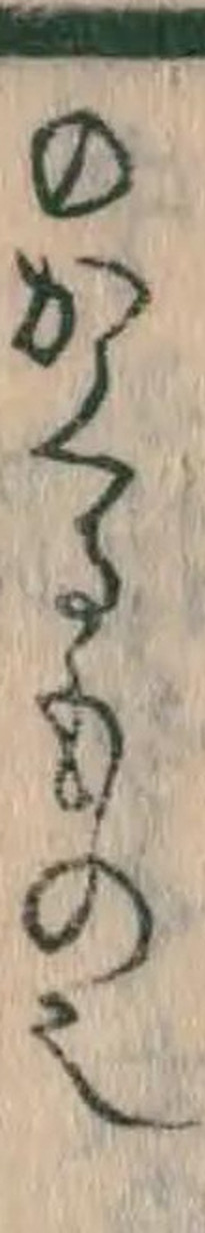のかくるもの也
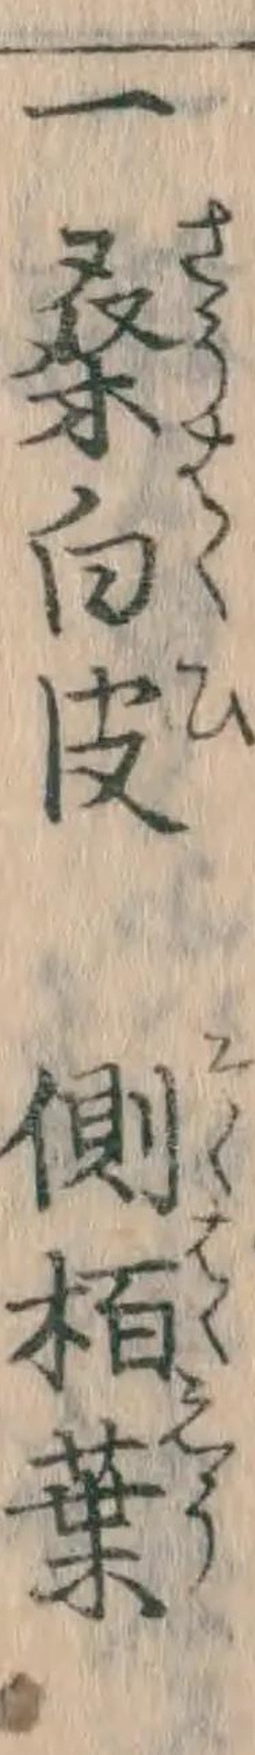一桑白皮側柏葉
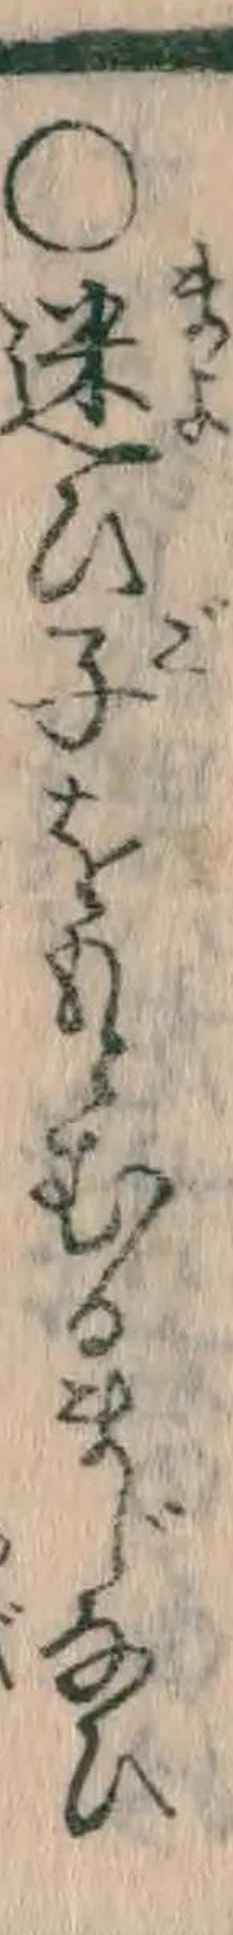○迷ひ子をもとむるまじなひ
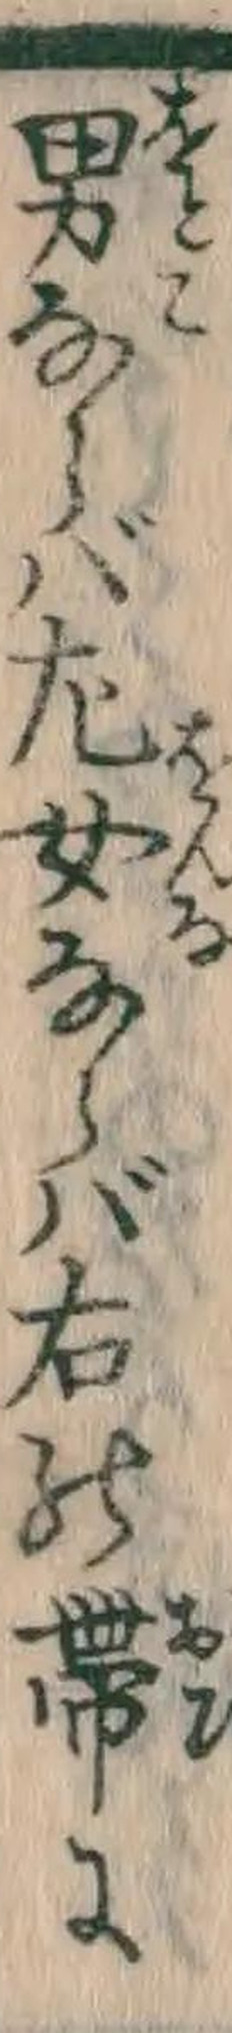男ならば左女ならば右の帯に
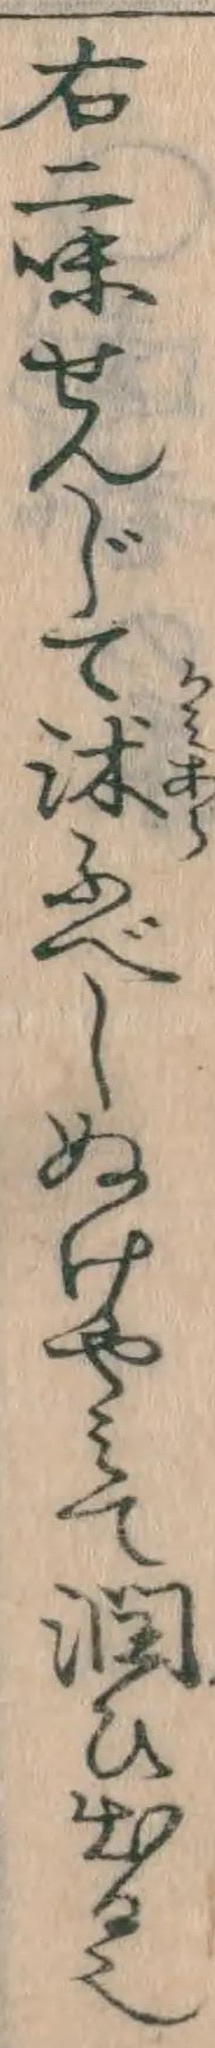右二味せんじて沐ふべしぬけやみて潤ひ出る也
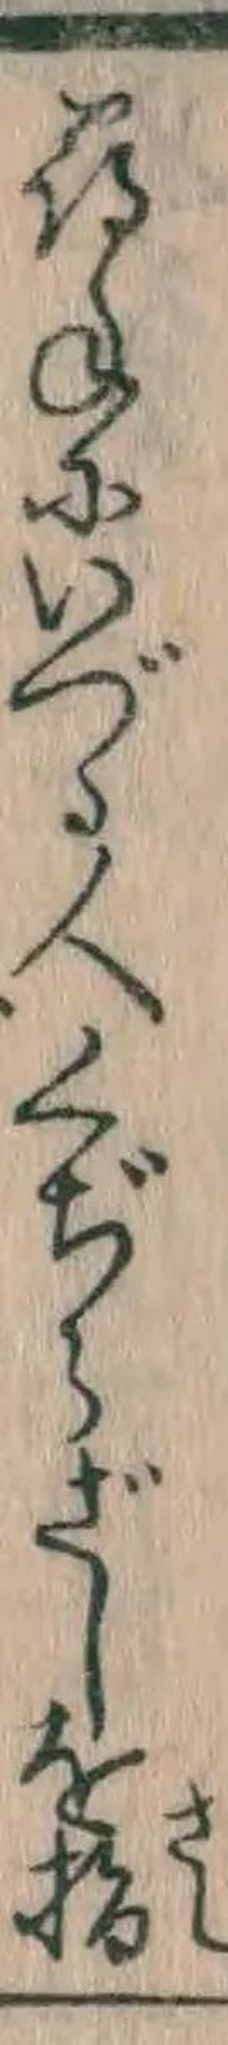尋ねにいづる人くぢらざしを指
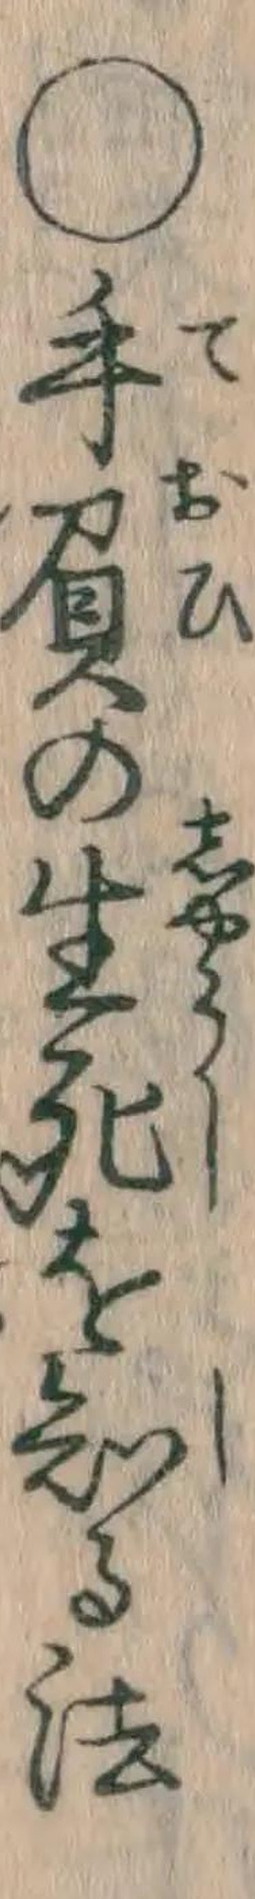○手負の生死を知る法
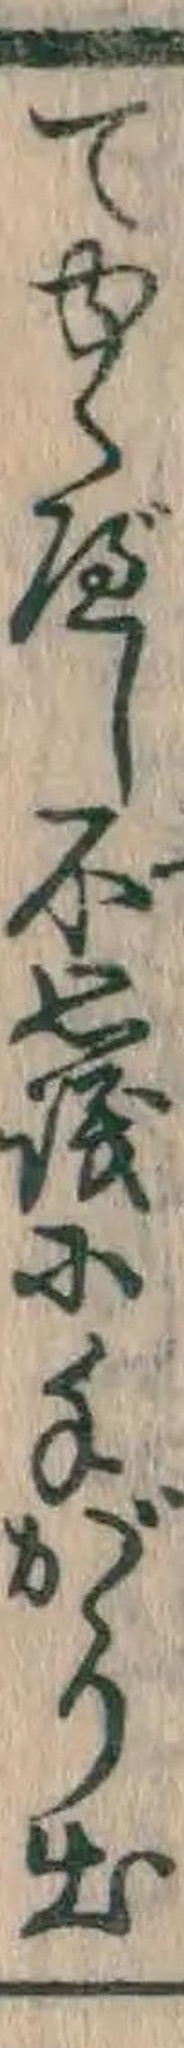てゆくべし不思議に手がゝり出
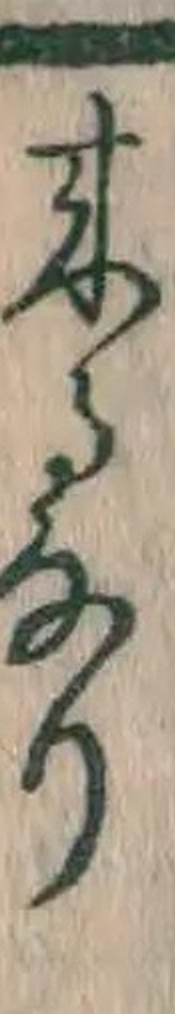来るなり
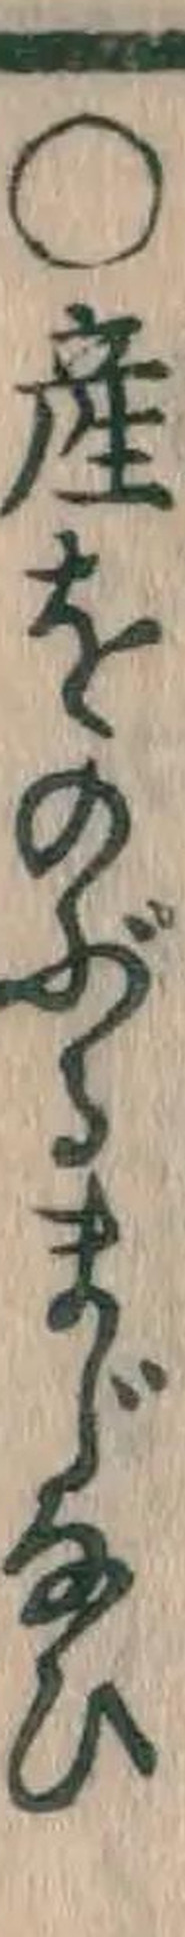○産をのぶるまじなひ
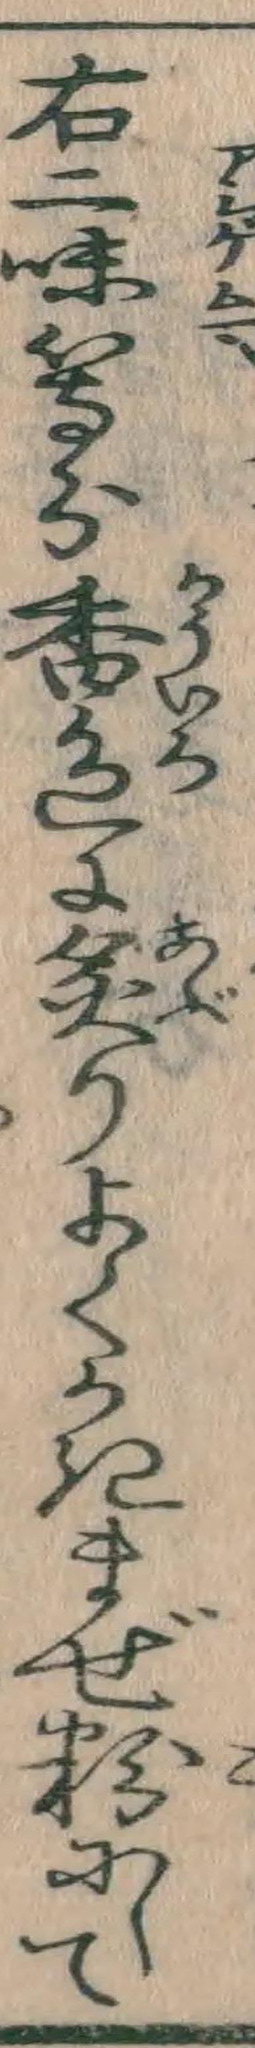右二味等分香色に炙りよくかきまぜ粉にして
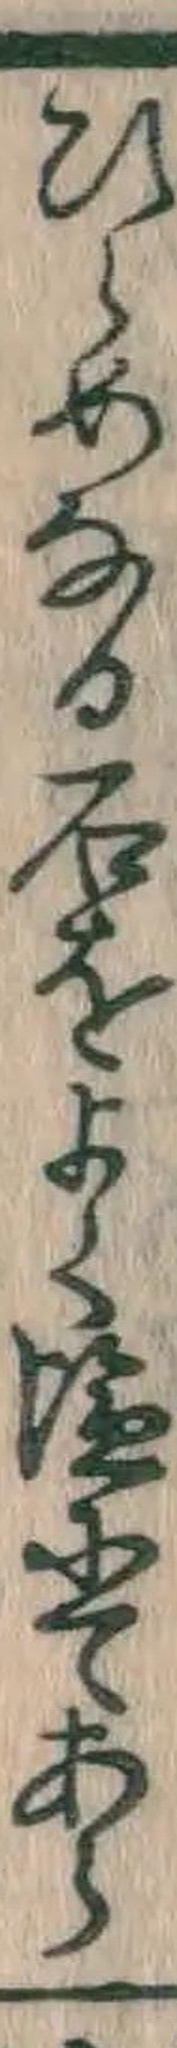ひらめなる石をよく塩にてあら
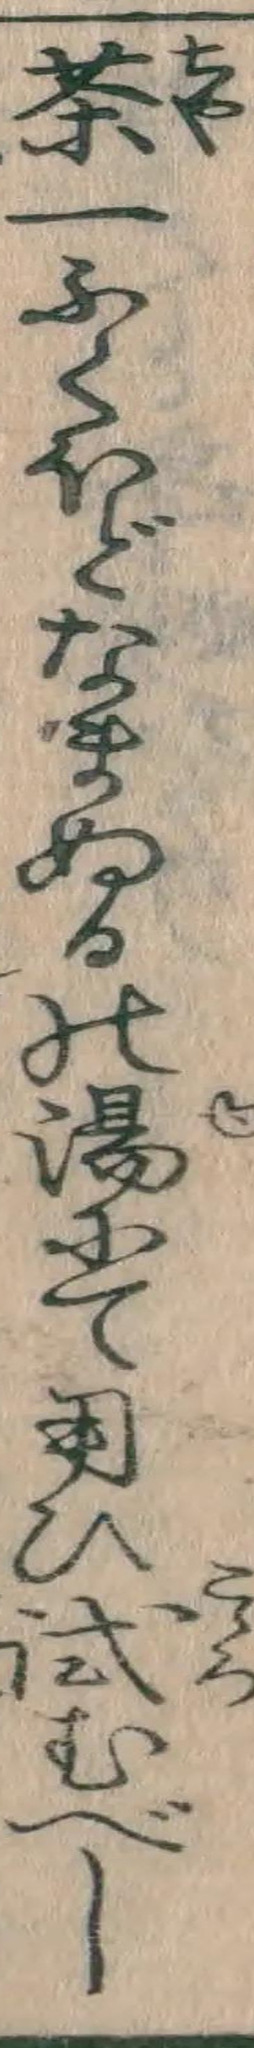茶一ふくほどなまぬるの湯にて用ひ試むべし
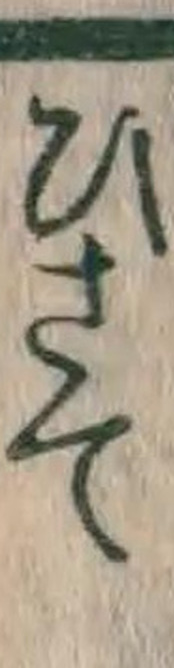ひさて
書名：広益秘事大全 3巻. [4]
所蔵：国立国会図書館 National Diet Library, JAPAN
